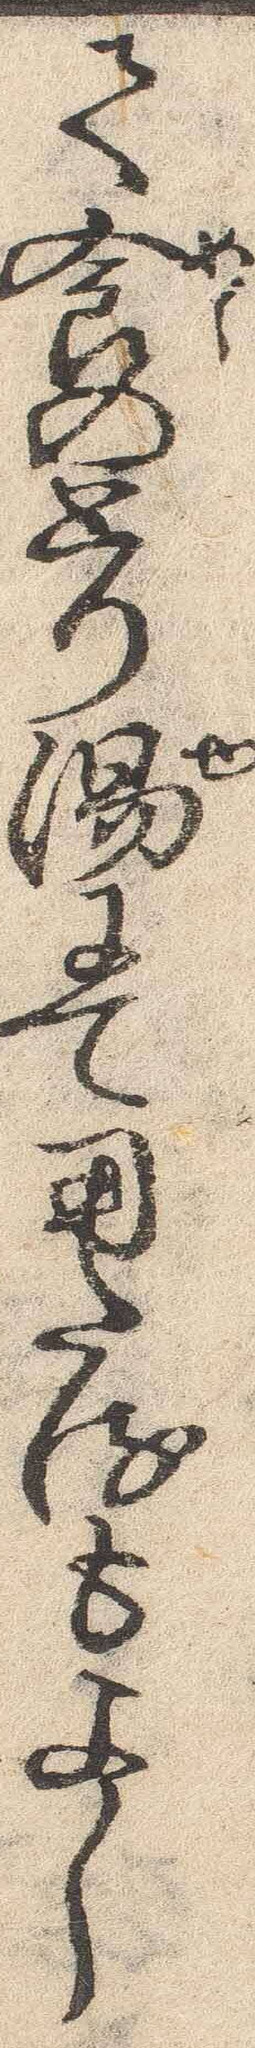て食のとり湯にて用たるもよし
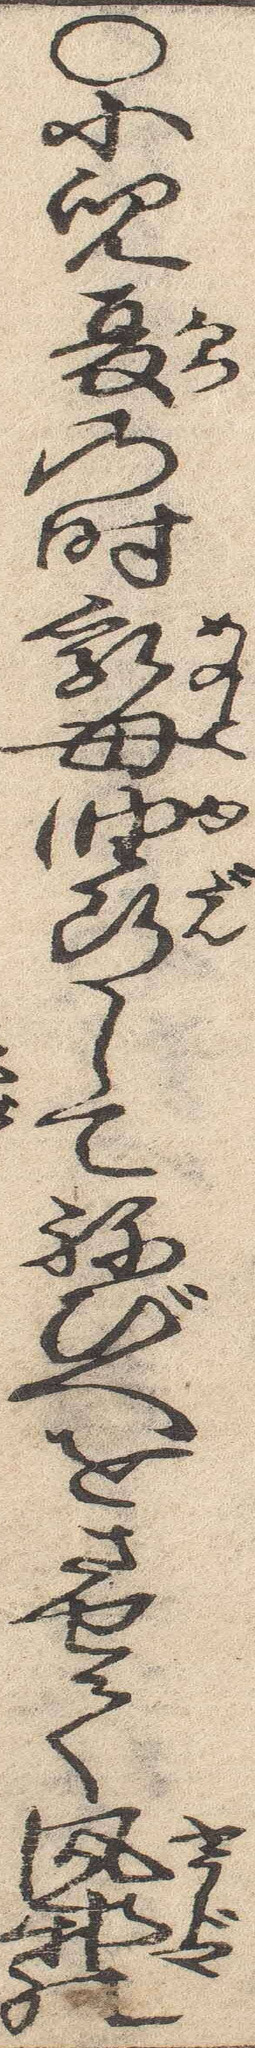○小児夏の時乳母油断してねびへをさせて風邪の
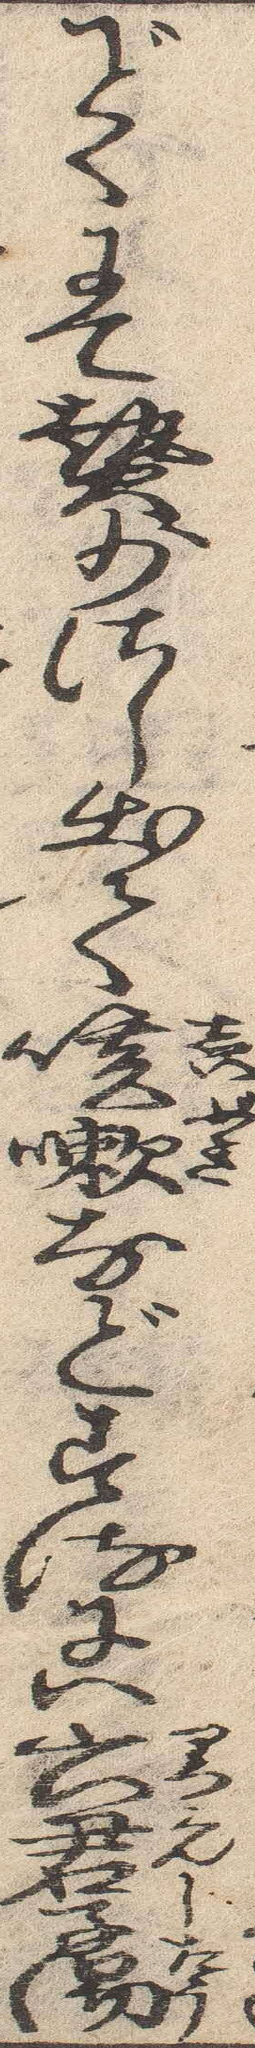ごとくにて熱少さし出て咳嗽などするには六君子湯
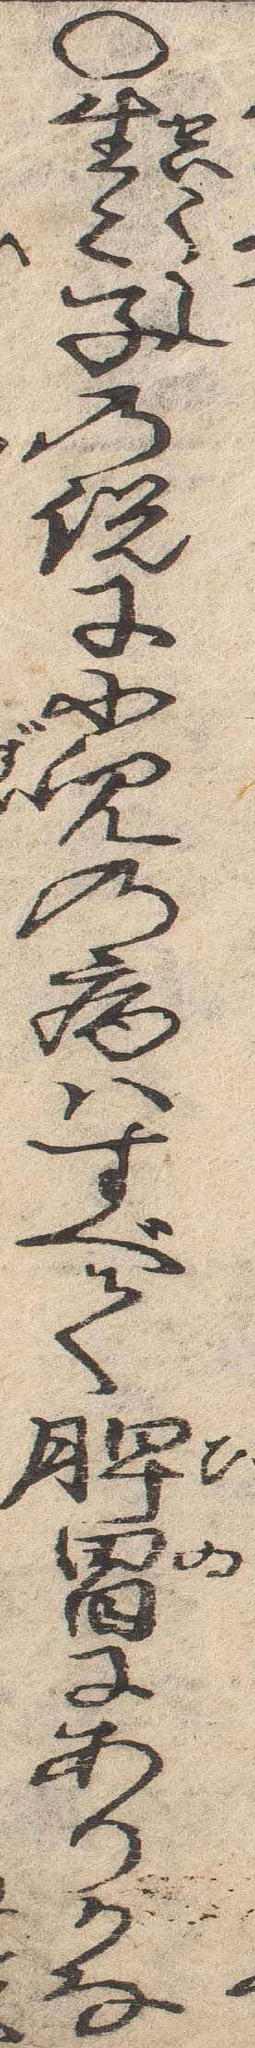○生々子の説に小児の病はすべて脾胃にありかな
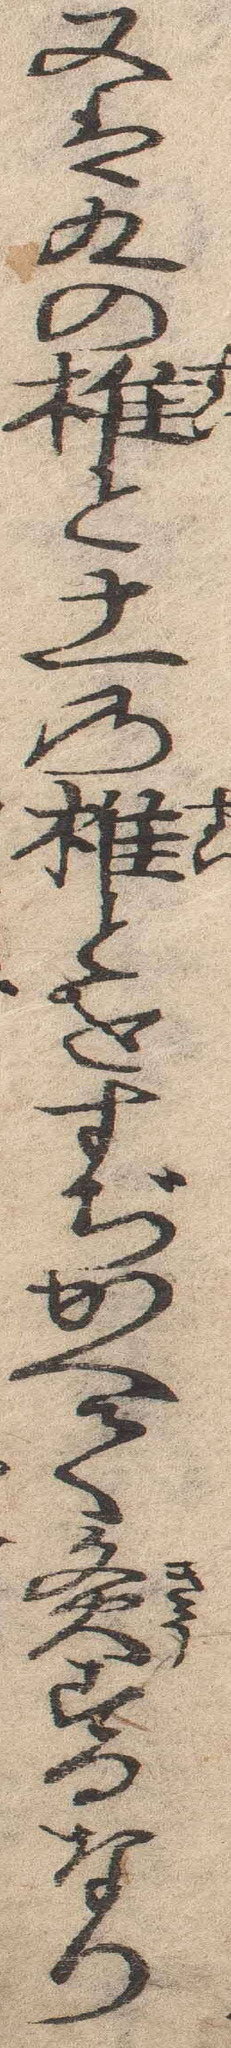又は九の椎と十一の椎とをすぢかへて灸するなり
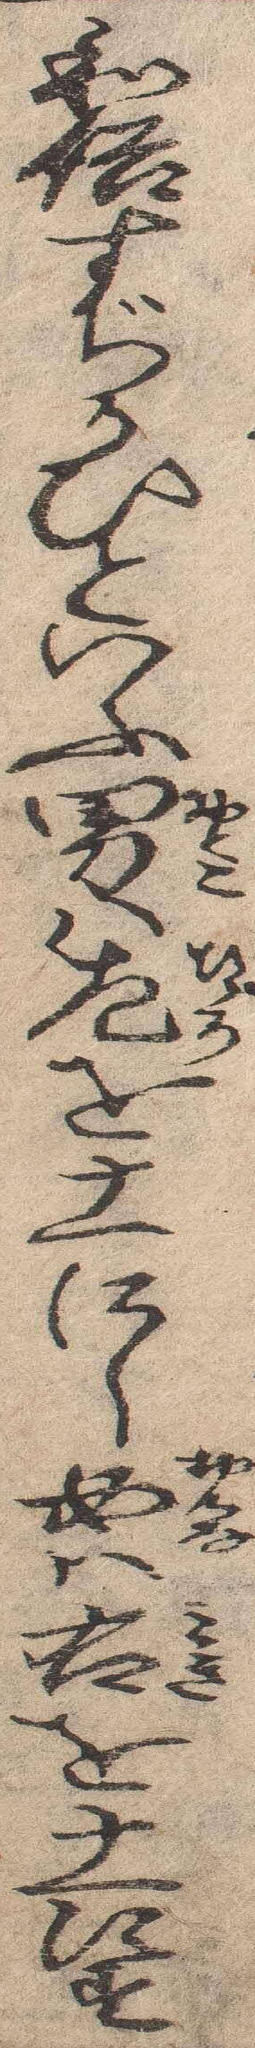和俗すぢかひといふ男は左を十一にし女は右を十一にす

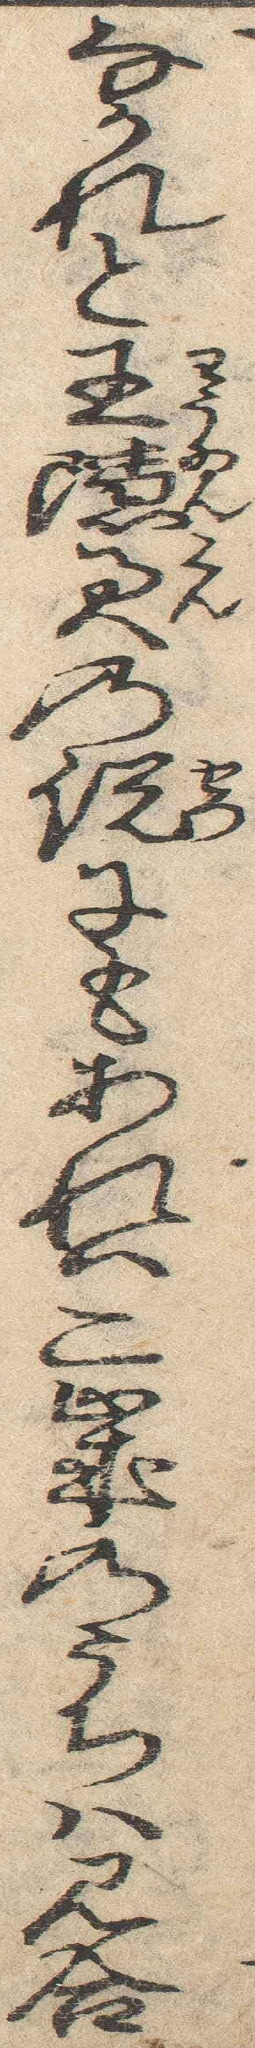なかれと王隠君の説にもあれは二歳のうちは見合
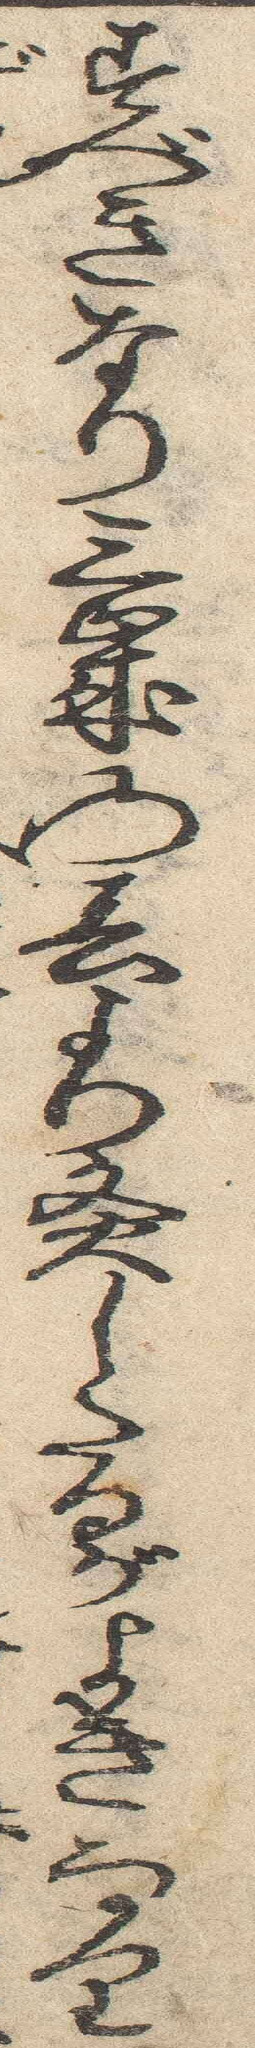すべきなり三歳の春より灸したるがよきなり
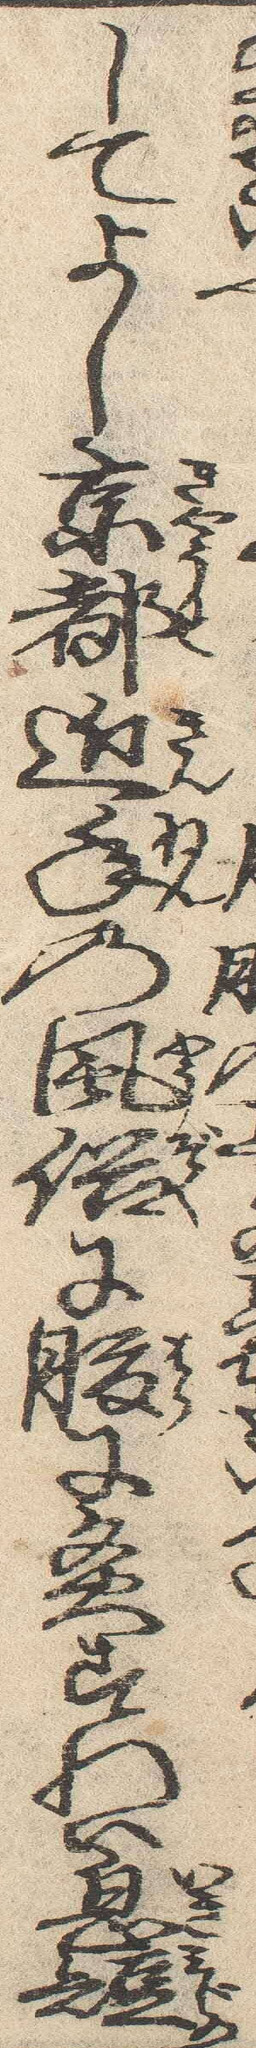してよし京都近年の風俗に腹に灸すれは息短
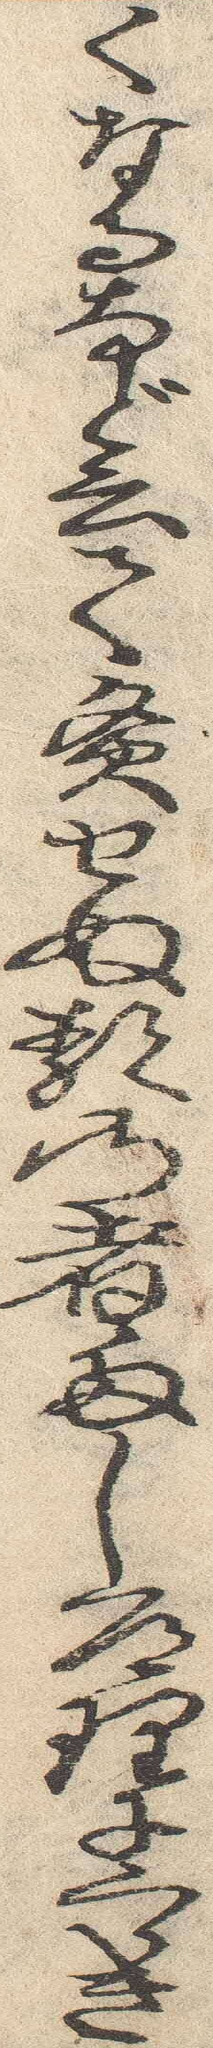くなるなど云て灸せぬ類の者多し道理にくらき
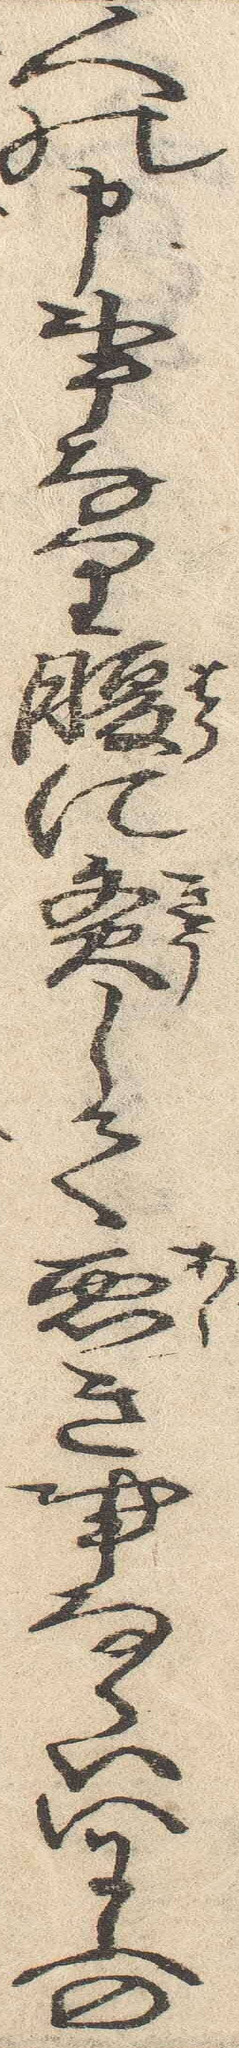人の申事なり腹に灸して悪き事ならはいにしへの
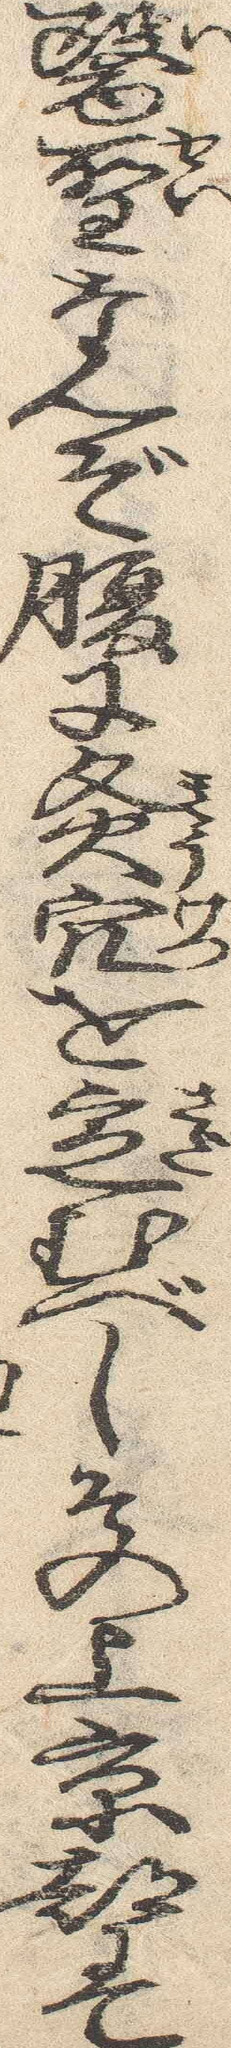医聖なんぞ腹に灸穴を定むべしその上京都にて
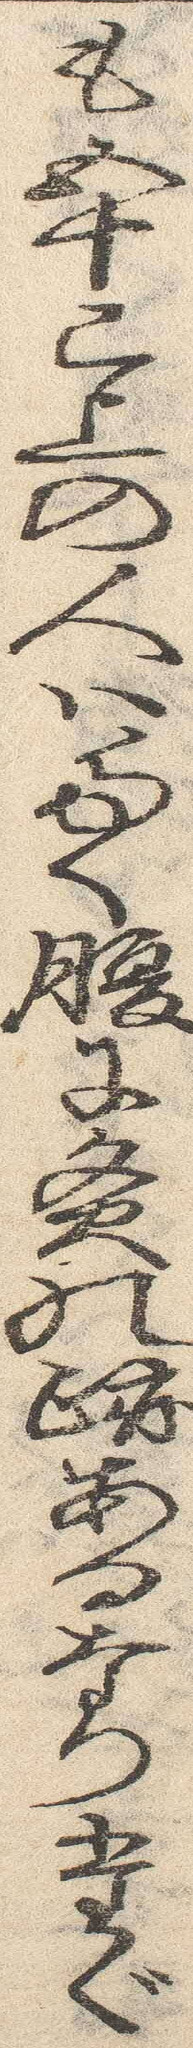も五十已上の人は多く腹に灸の跡あるなりたゞ
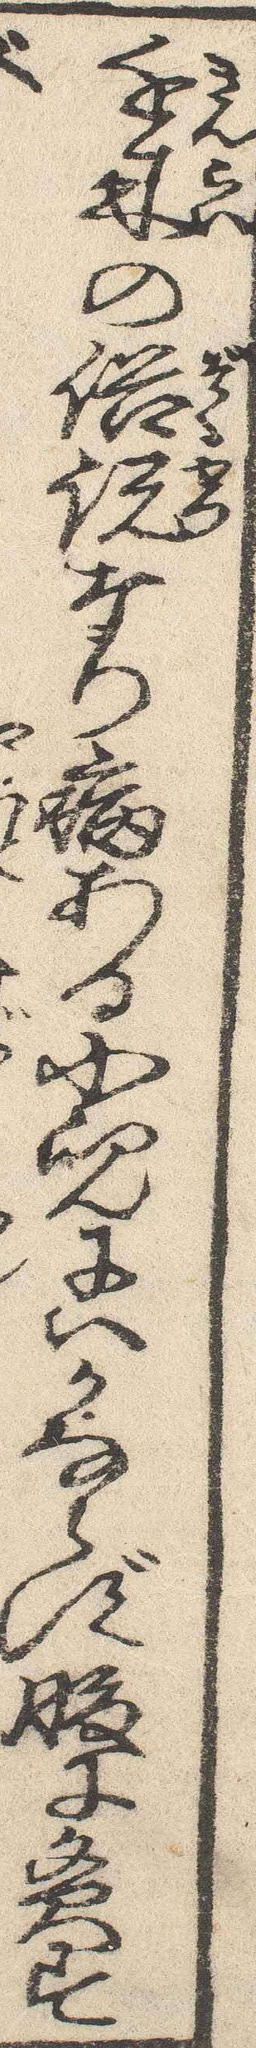近来の俗説なり病ある小児にはかならず腹に灸す
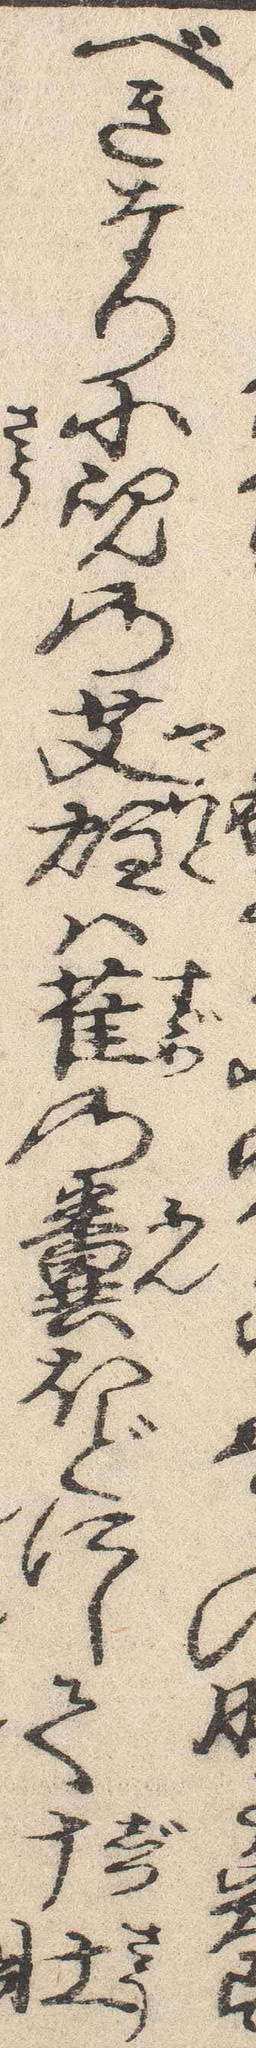べきなり小児の艾炷は雀の糞ほどにして十壮
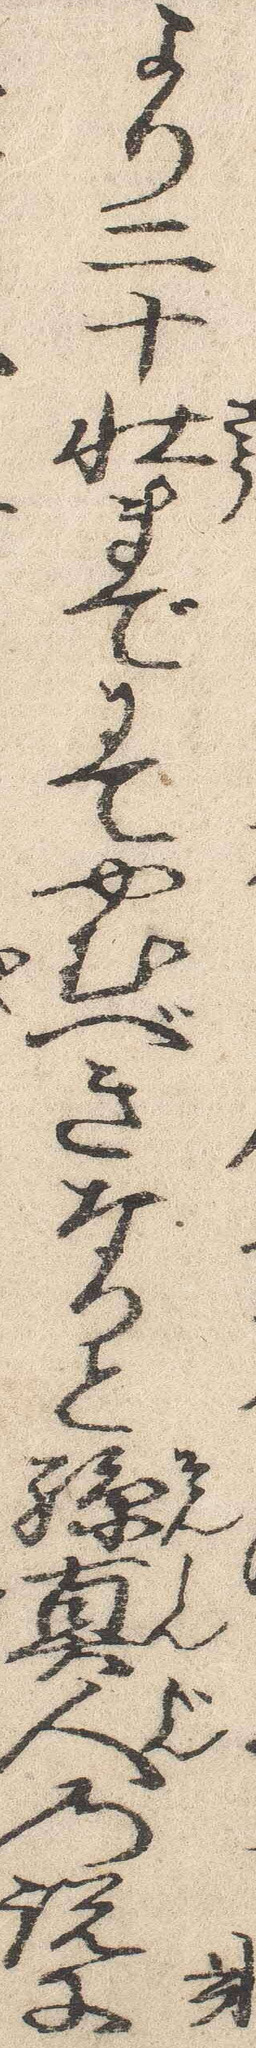より二十壮なでにてやむべきなりと孫真人の説に
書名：小児必用養育草
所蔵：東京学芸大学附属図書館 国文学研究資料館
